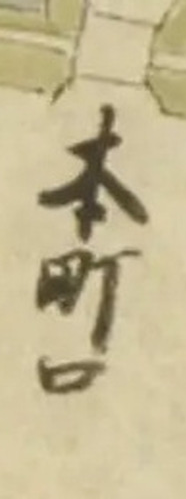本町口
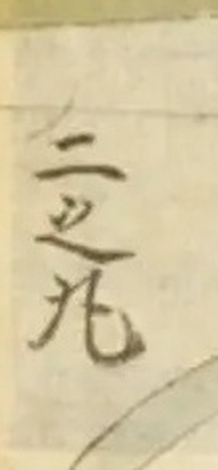三之丸
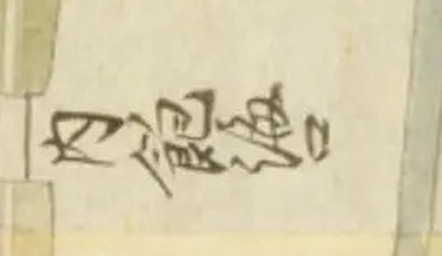内飽海口
